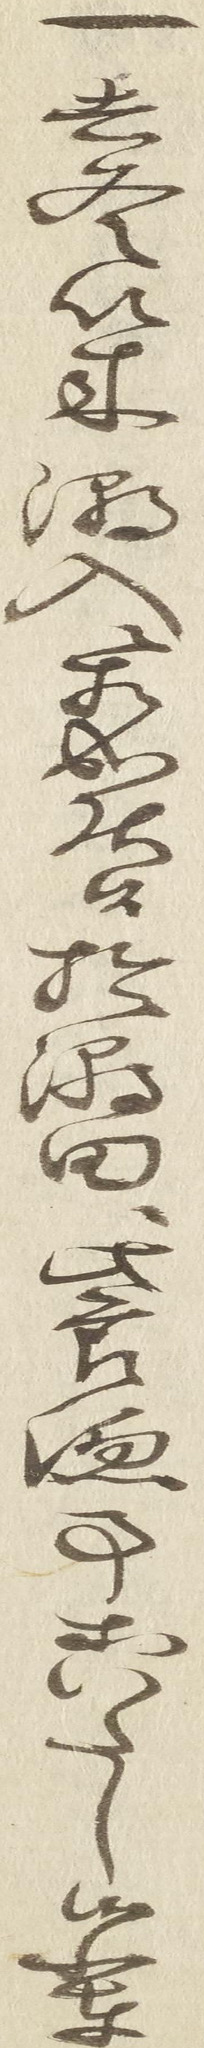一去冬以来潮入に相成居候於潮田此節漁事等いたし候輩
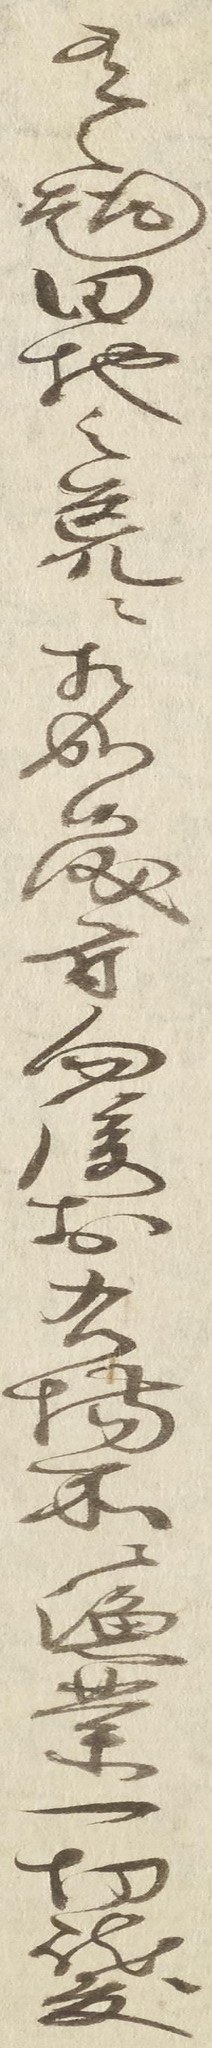有之趣田地之荒に相成候に付向後於右持所に漁業一切屹度
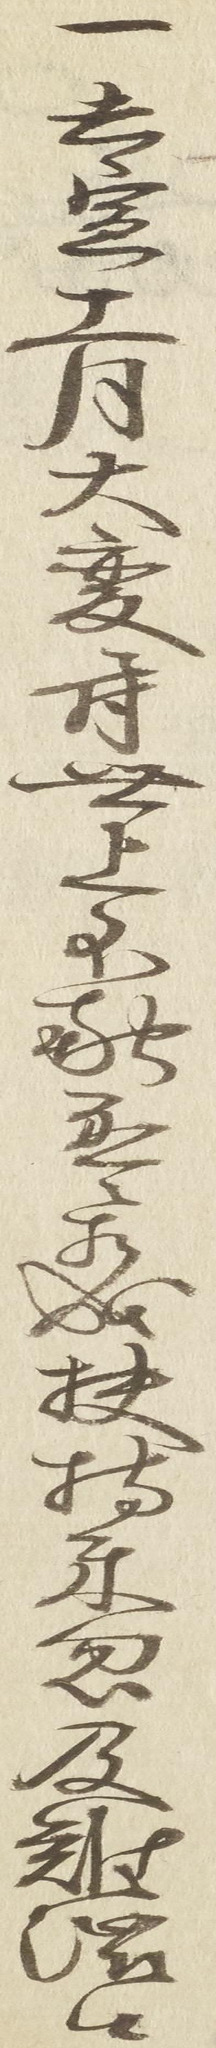一去寅十一月大変に付世上不融通に相成扶持米忽及難渋候
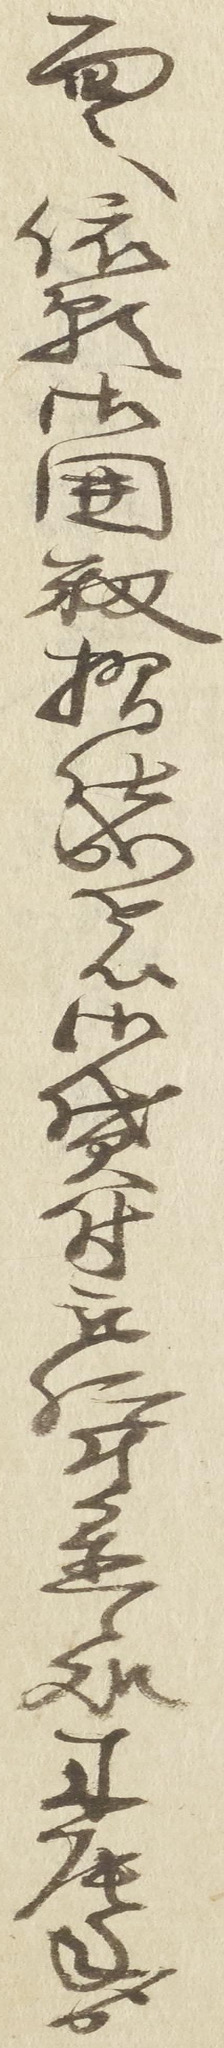面々へ依願御囲籾摺仕成を以御貸付被仰付置候処来辰年より
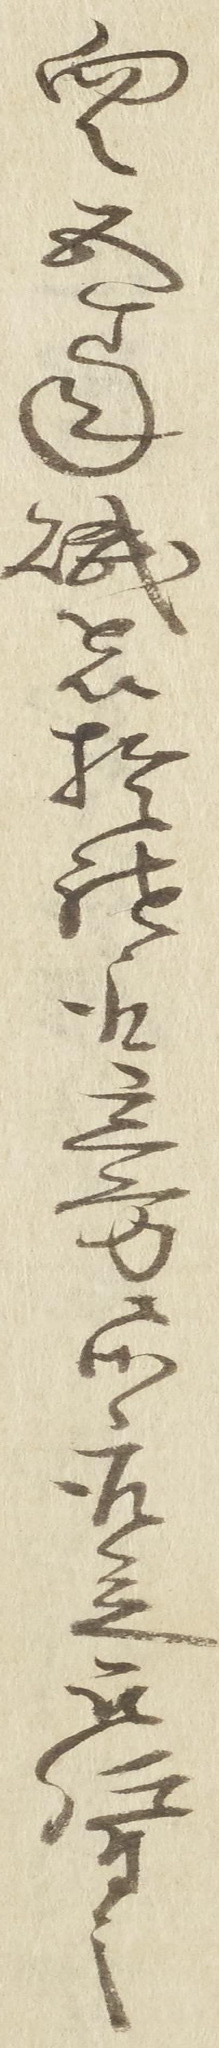向々五ケ年賦を以於諸取立方に御取立被仰付之

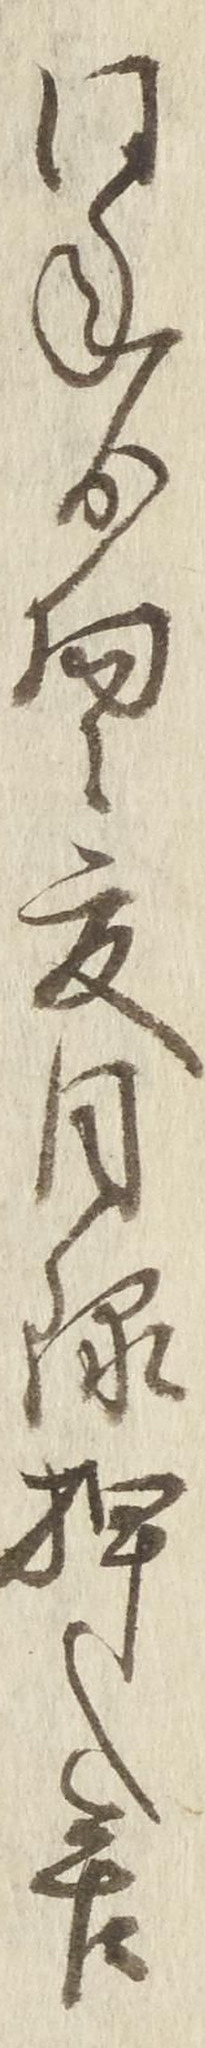同年より向々度目録押候筈
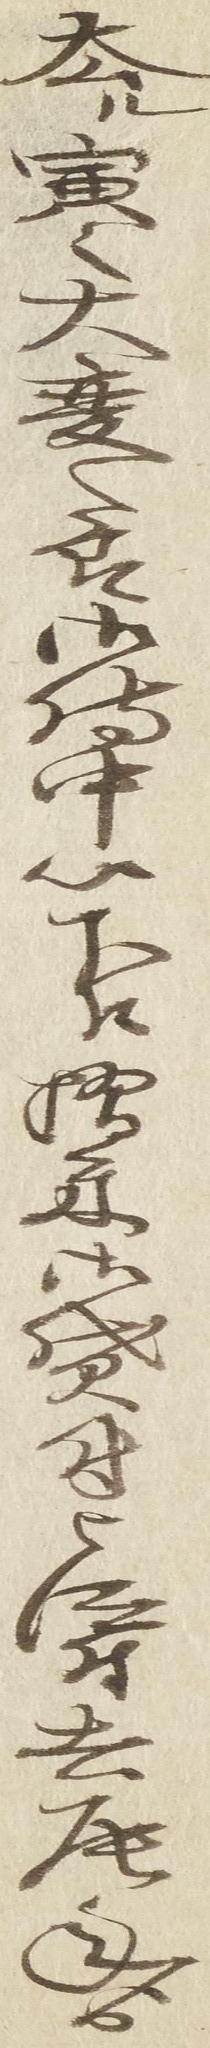去る寅之大変之節御侍中以下え摺米御貸付被仰付去辰年より
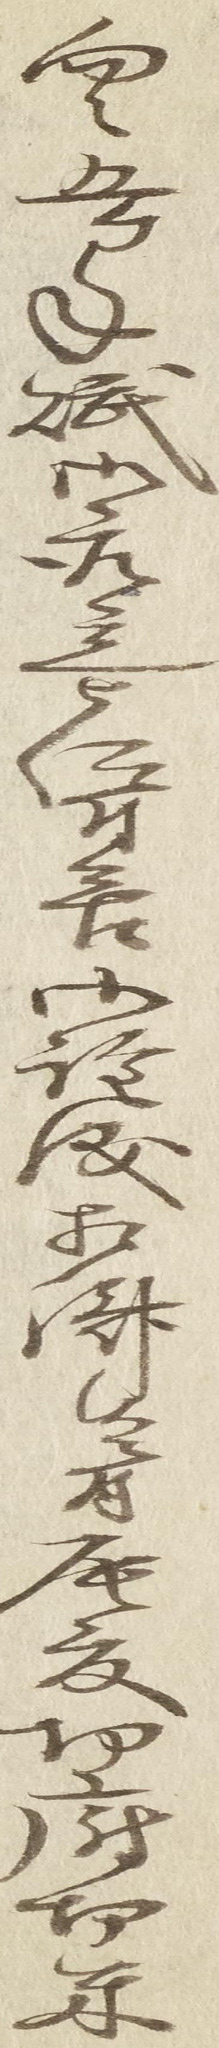向五ヶ年賦御取立被仰付筈御詮議相済候に付辰度切府切米
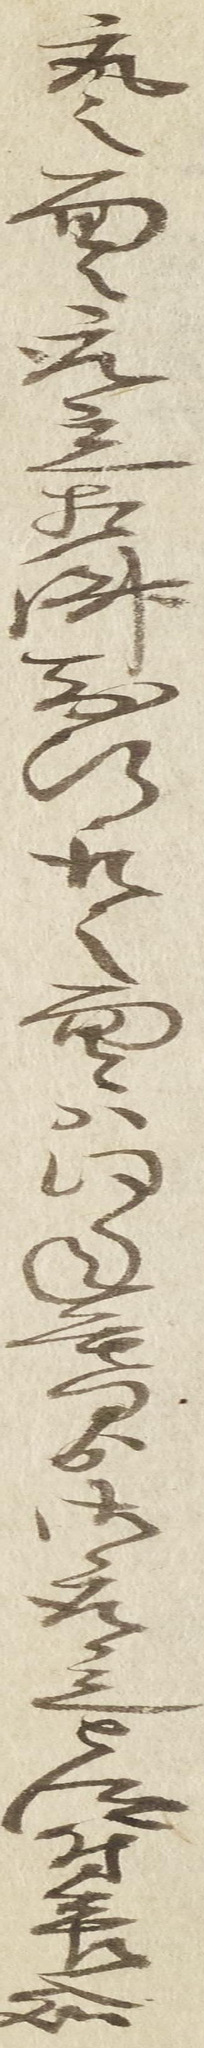取之面々取立相済知行取之面々は同年暮より御取立被仰付筈之処
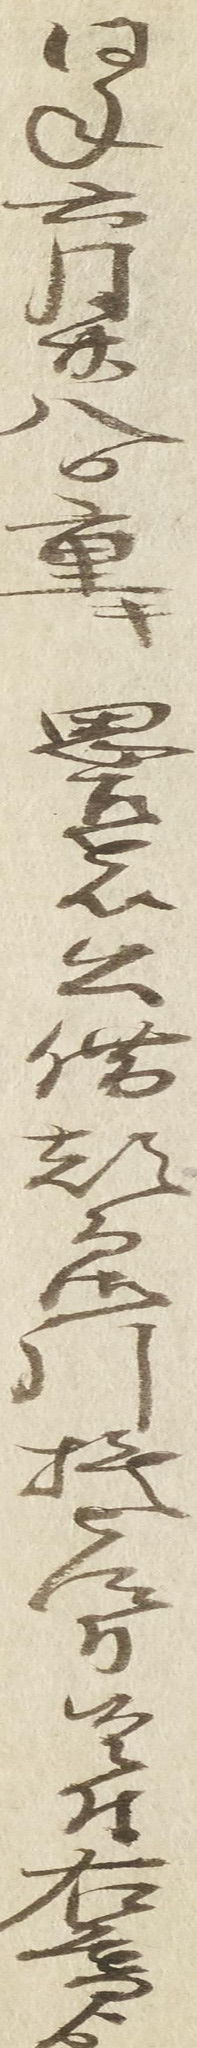同年六月廿八日重き思召を以公借都而御引捨被仰付候に付右暮より
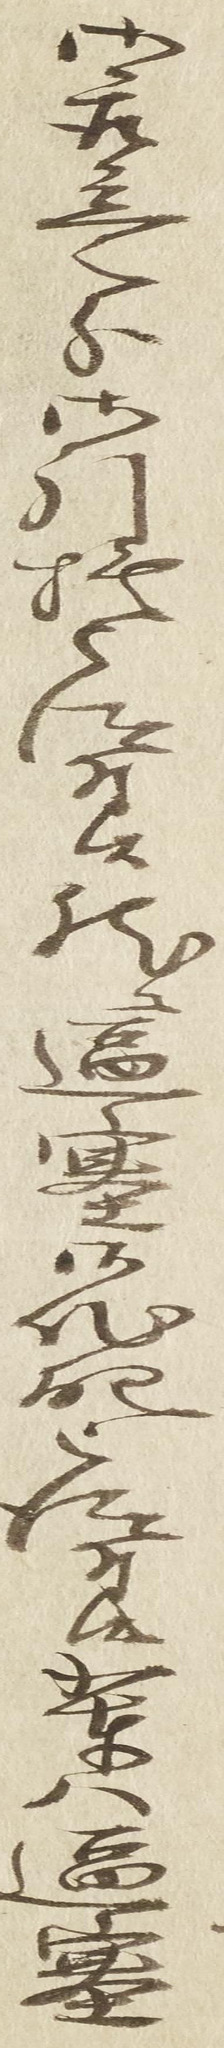御取立之分御引捨被仰付候然に逼塞御心配被仰付候輩は逼塞
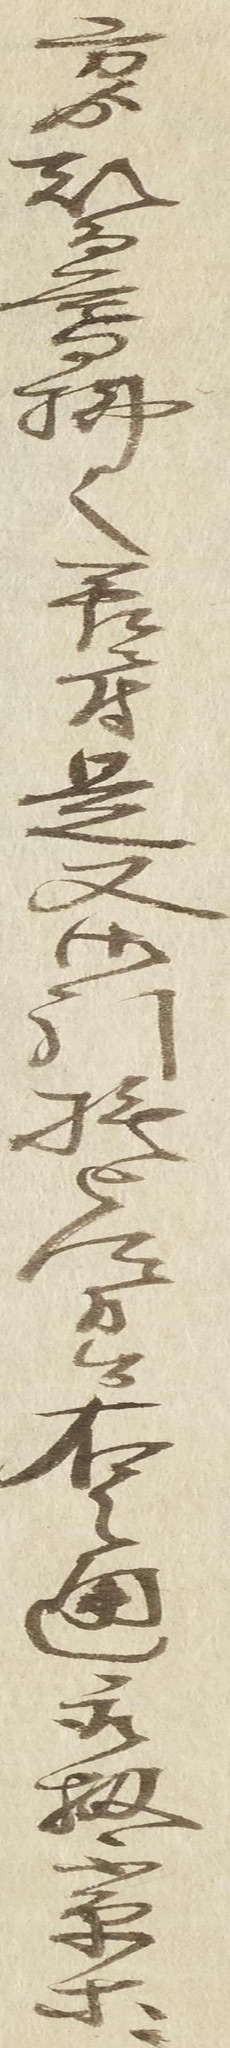方より都而暮払之筈に付是又御引捨被仰付候右之通取扱不平等
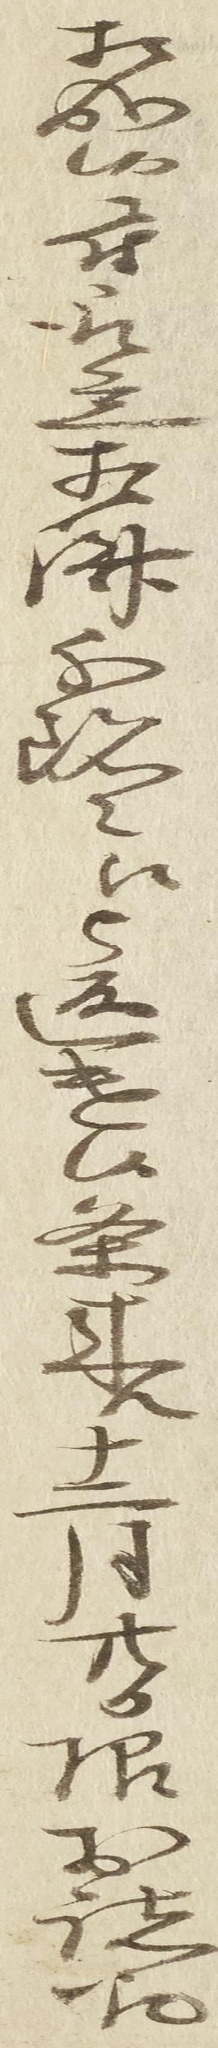相成候に付取立相済分銘々え被返遣候条来る十二月廿日限於諸取
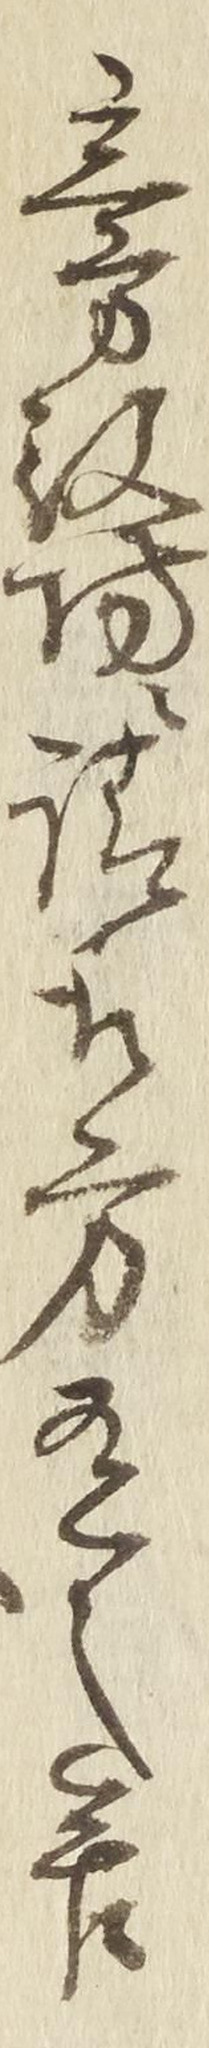立方役場に請取有之筈
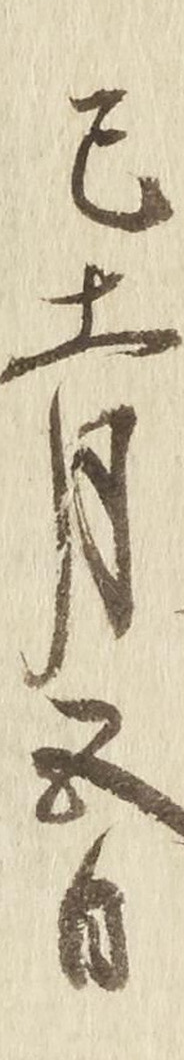巳十一月五日
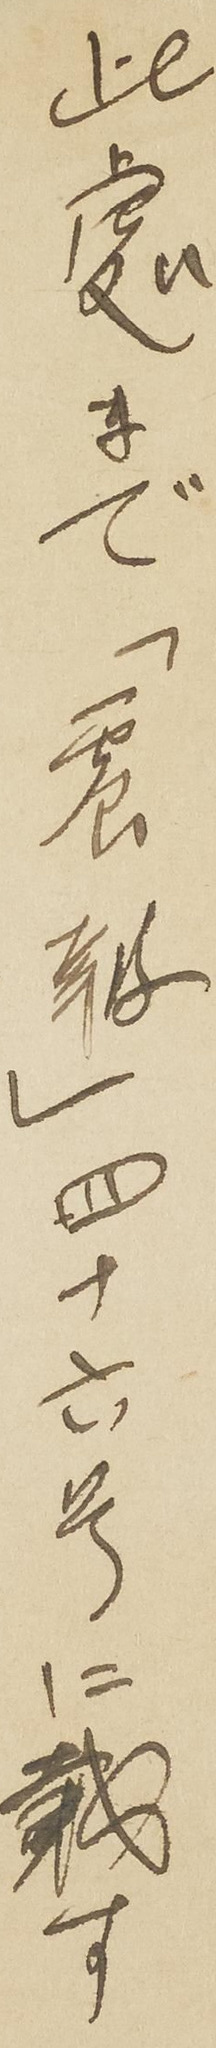此処まで「震報」四十六号に載す
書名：地震記　上
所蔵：東京大学地震研究所図書室 Earthquake Research Institute Library, The University of Tokyo, JAPAN
